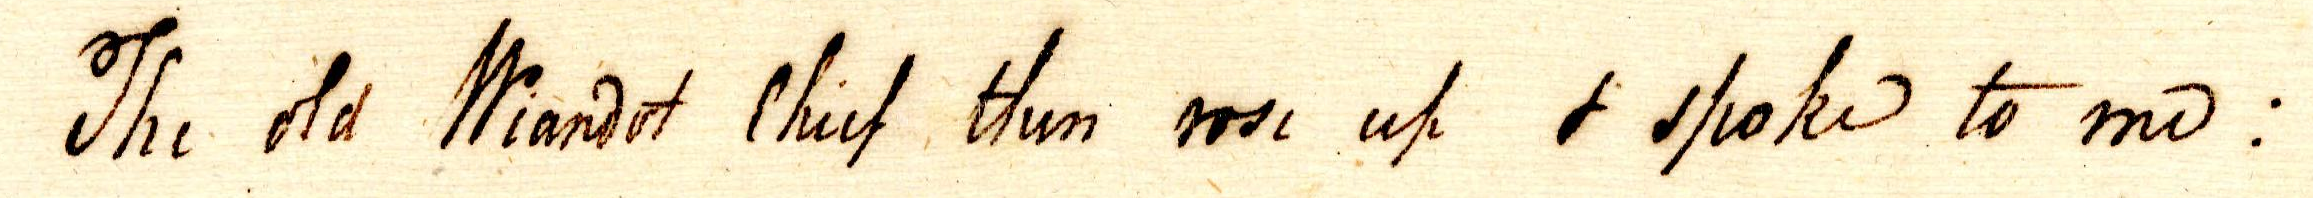The old Wiandot Chief then rose up & spoke to me:
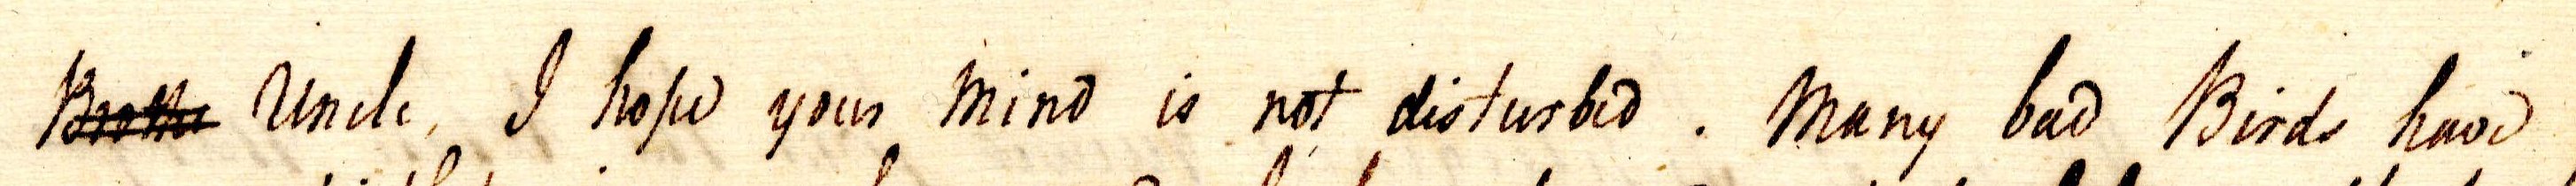Brother Uncle, I hope your Mind is not disturbed. Many bad Birds have
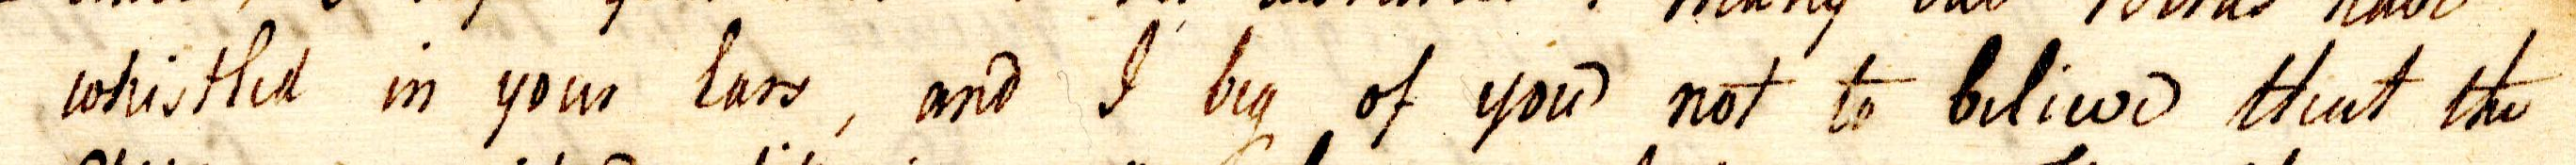whistled in your Ears, and I beg of you not to believe that the
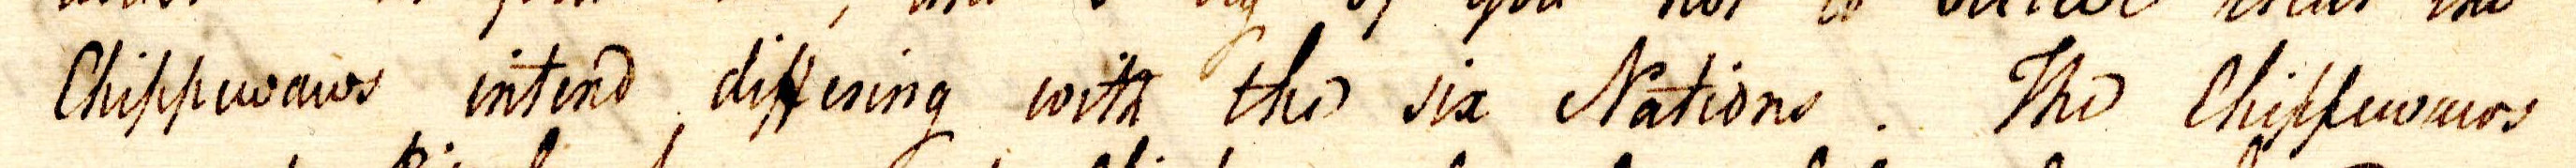Chippewaws intend differing with the six Nations. The Chippewaws
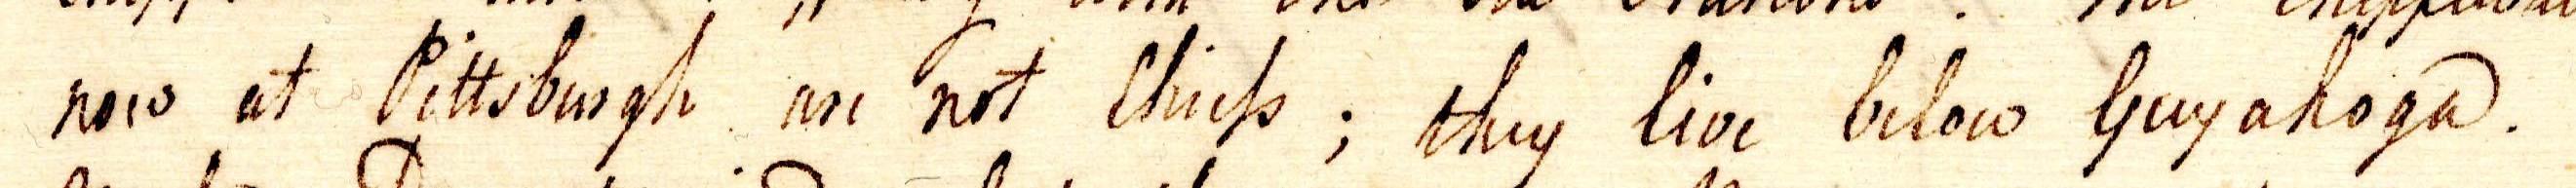now at Pittsburgh are not Chiefs; they live below Cuyahoga.
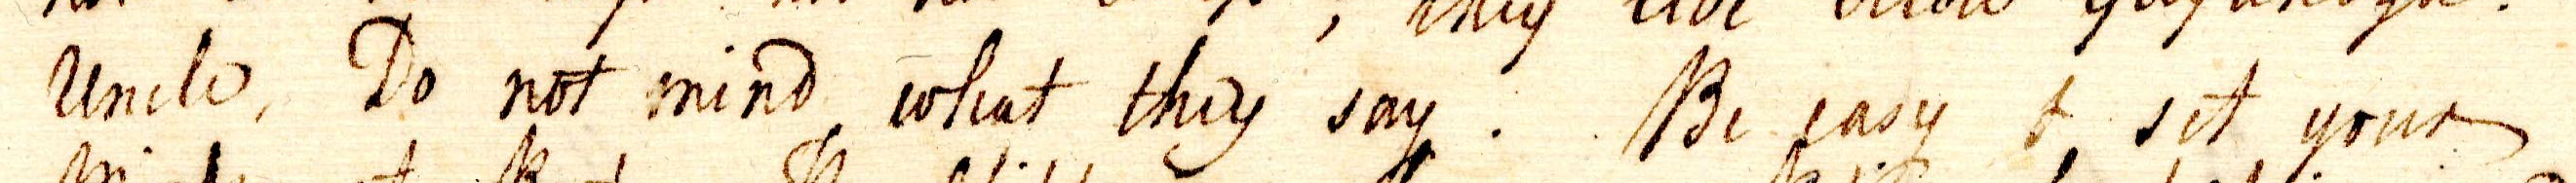Uncle, Do not mind what they say. Be easy & set your
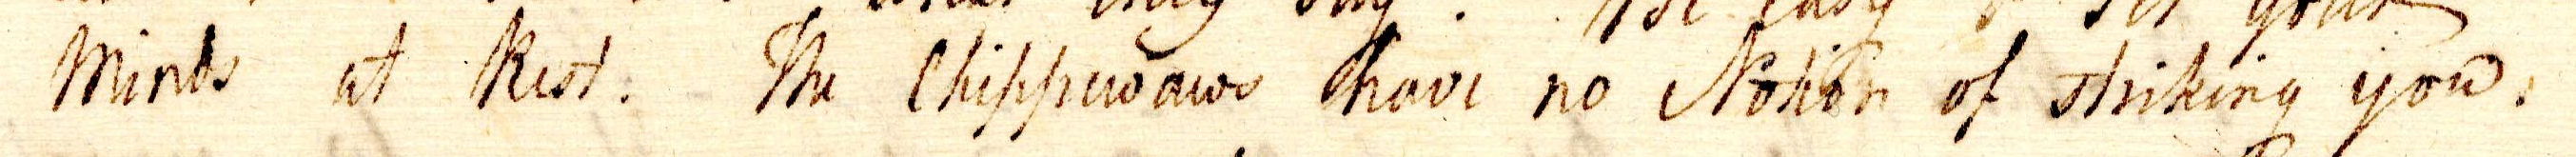Minds at Rest. The Chippewaws have no Notion of striking you.
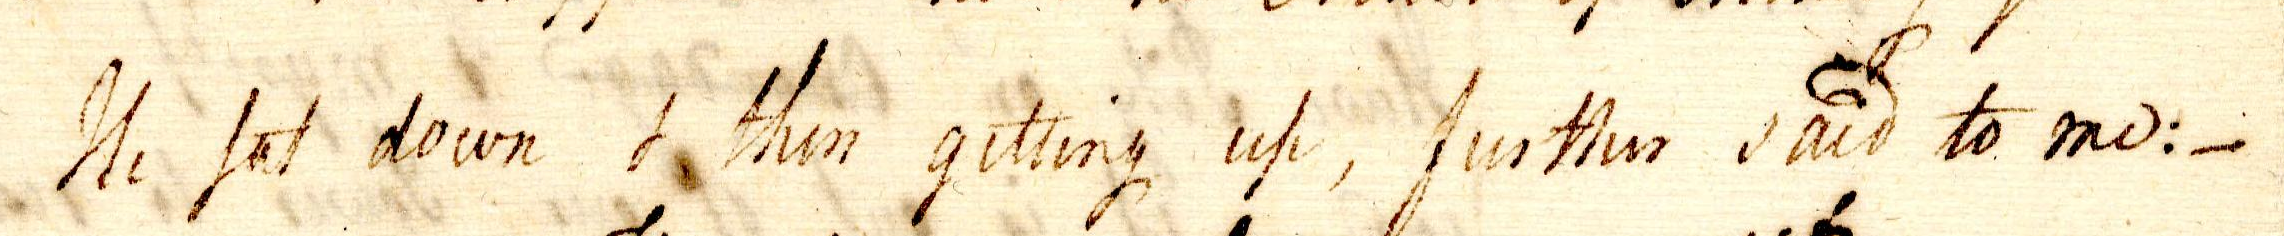He sat down & then getting up, further said to me:-
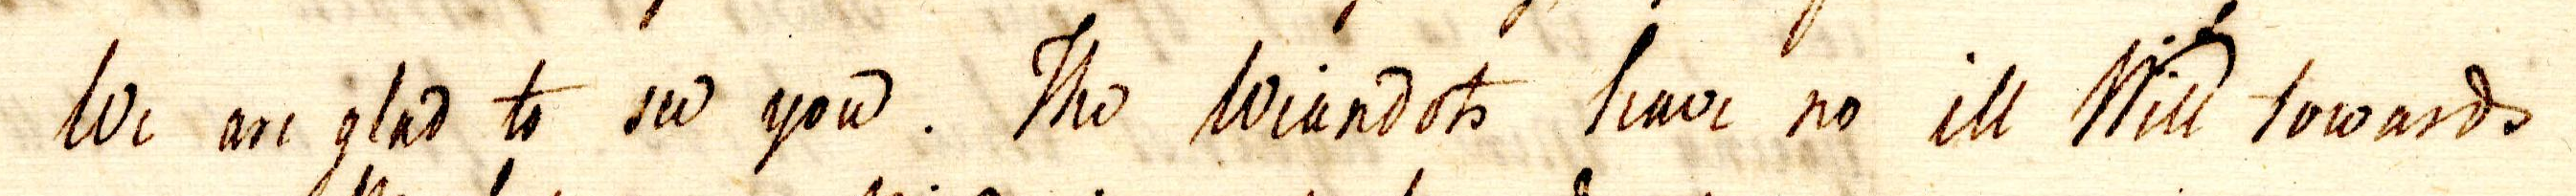We are glad to see you. The Wiandots have no ill Will towards
